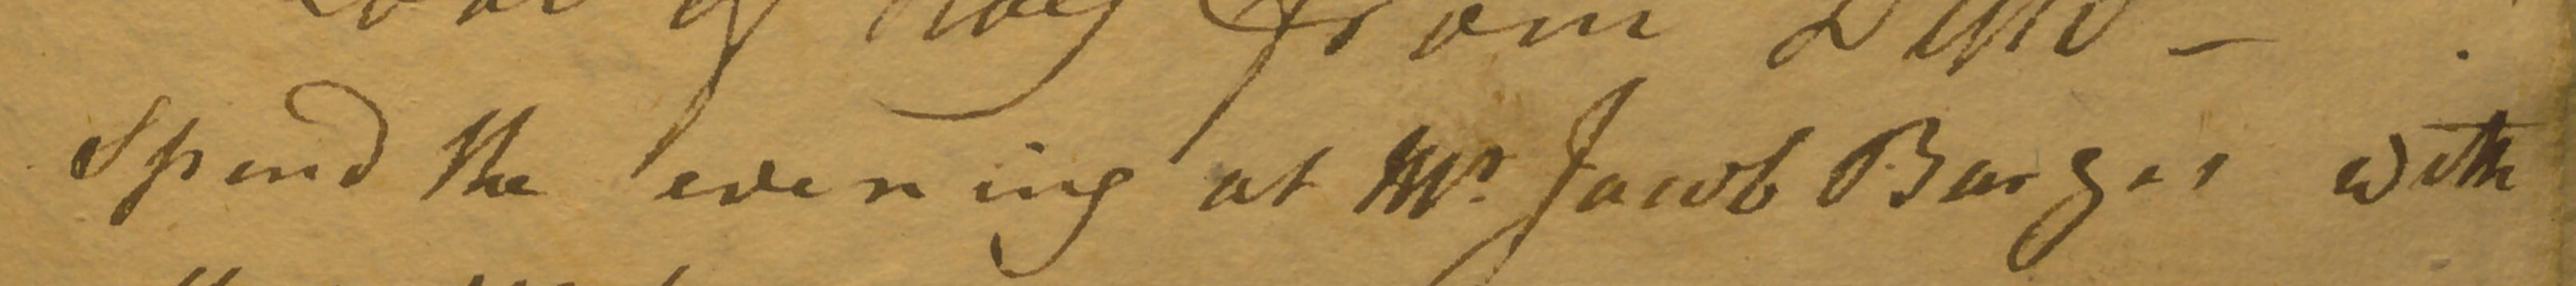spend the evening at M^r. Jacob Barges with
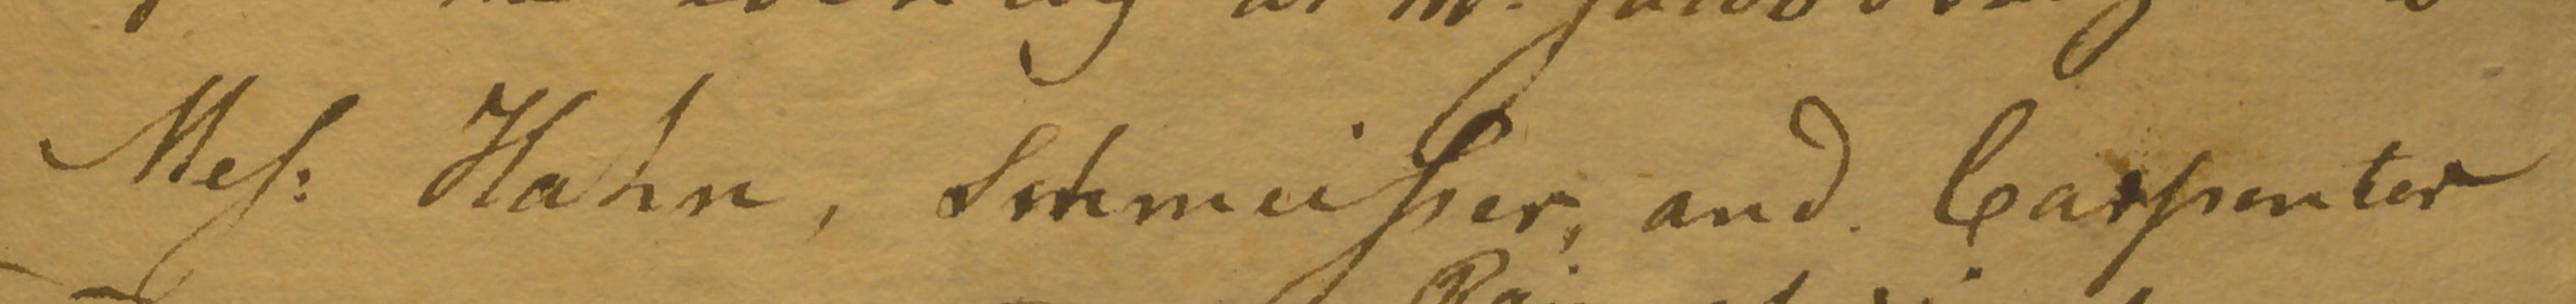Mes. Hahn, Schmeisser, and Carpenter
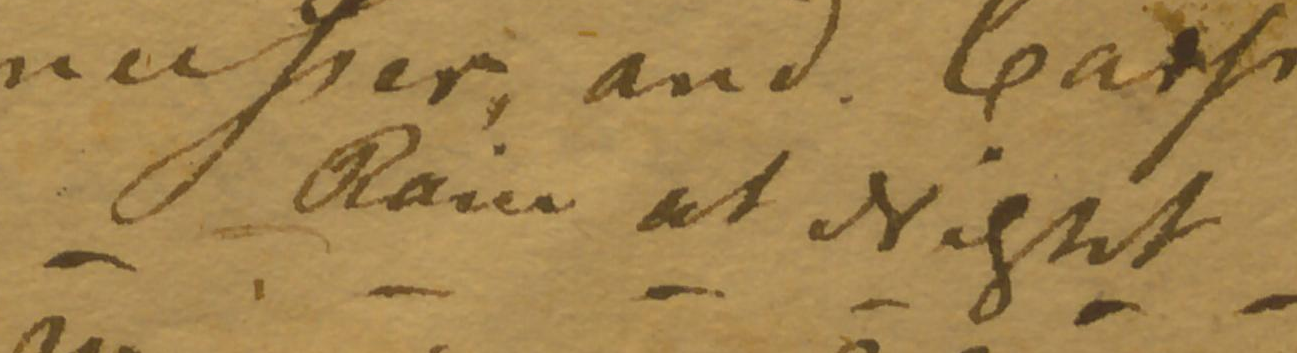Rain at Night
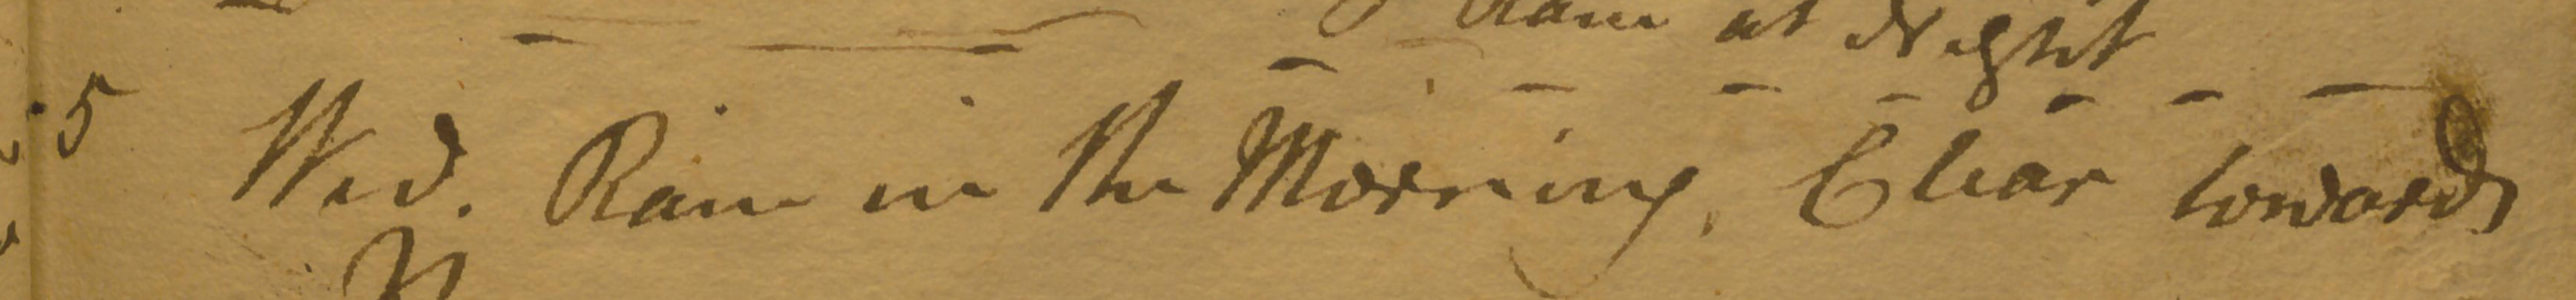5 Wed. Rain in the Morning, Clear towards
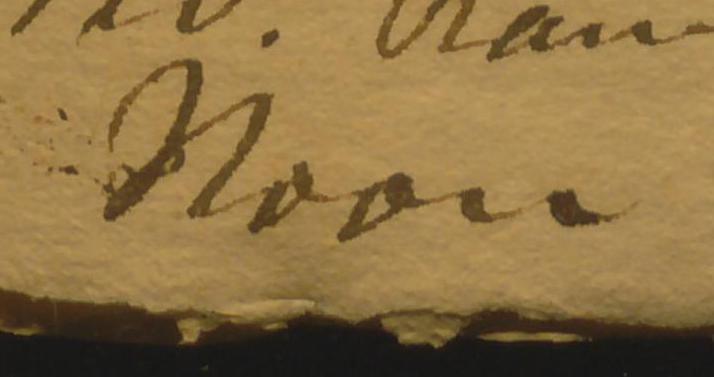Noon
